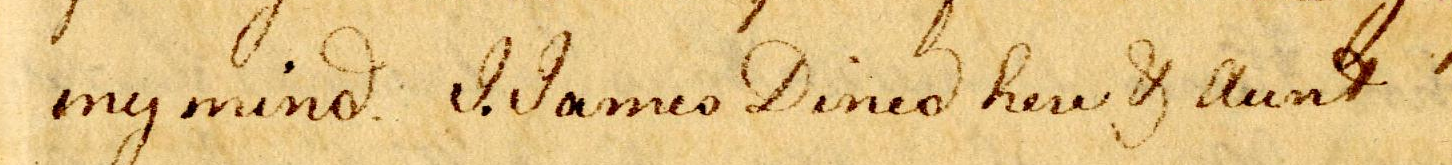my mind. I. James Dined here & Aunt
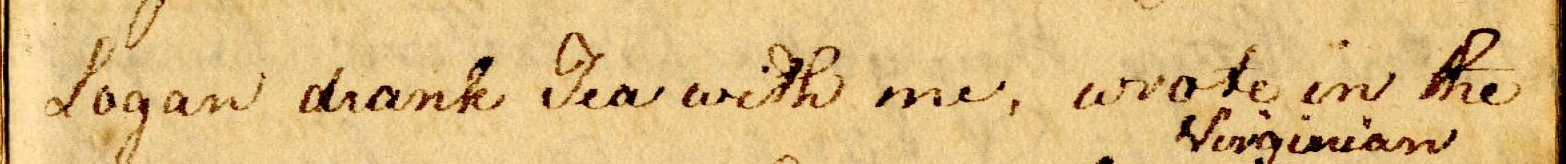Logan drank Tea with me, wrote in the
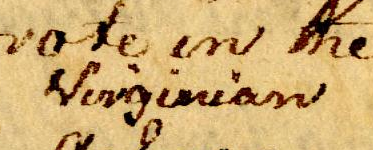Virginian
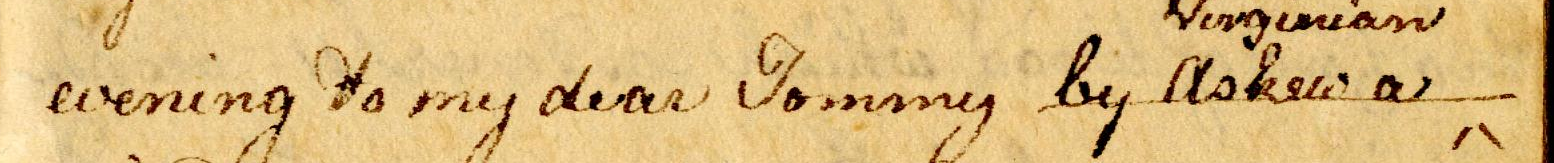evening to my dear Tommy by Askewa ^
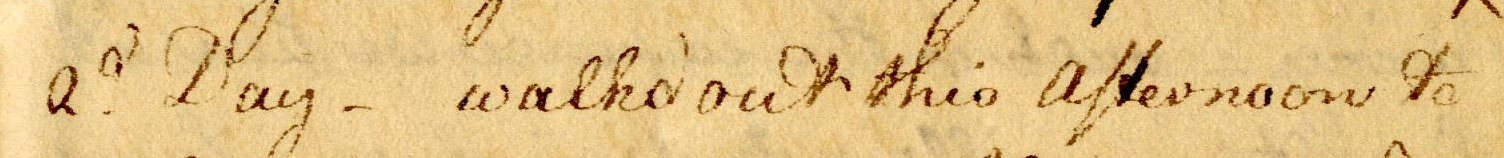2^d. Day- walkd out this Afternoon to
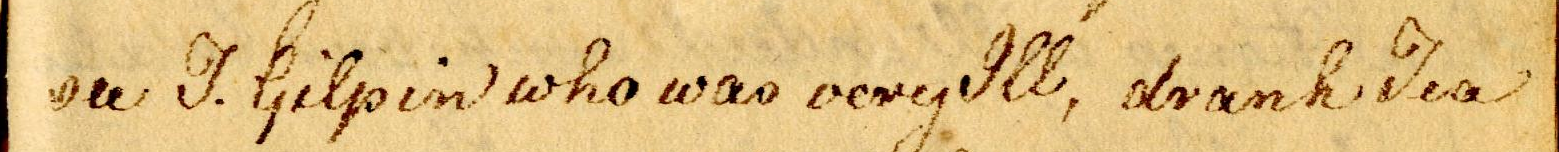see T. Gilpin who was very Ill, drank Tea
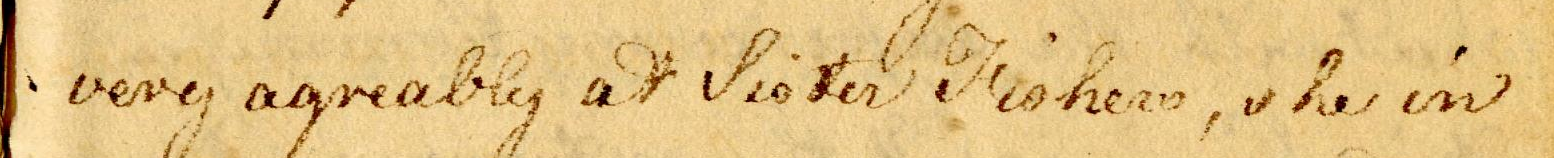very agreably at Sister Fishers, she in
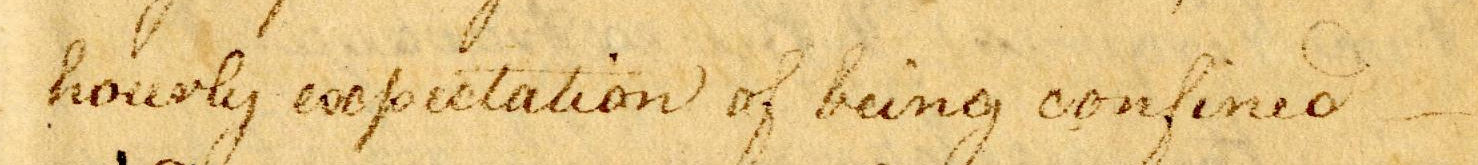hourly expctation of being confined
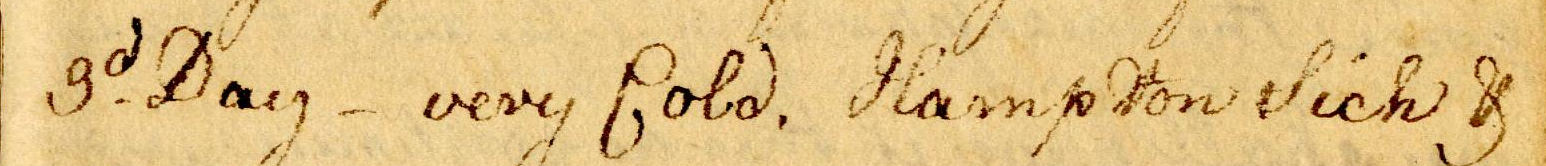3^d Day- very Cold, Hampton Sick &
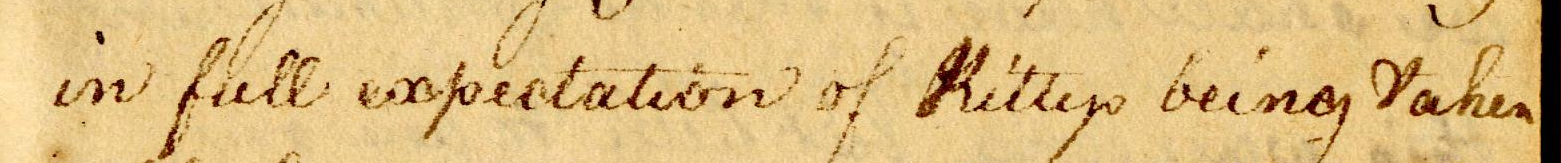in full expectation of Kittys being taken
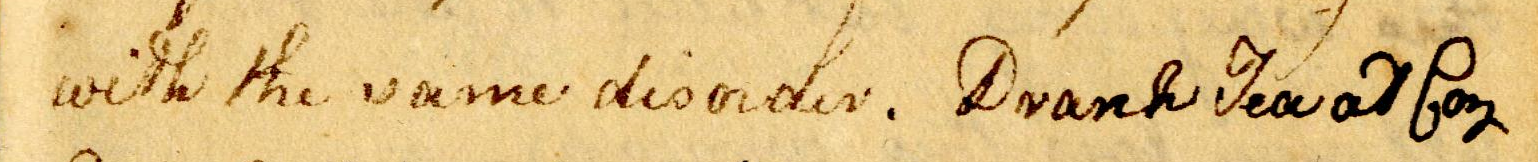with the same disorder. Drank Tea at Coz
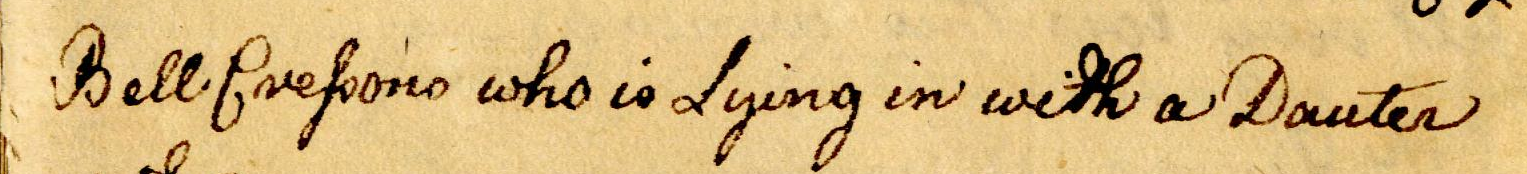Bell Cressons who is Lying in with a Dauter
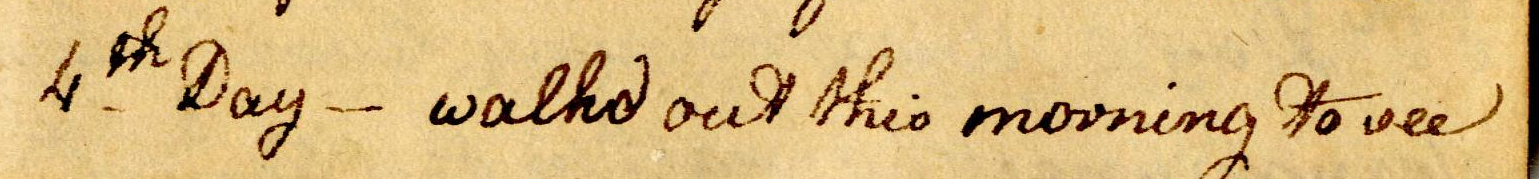4^th Day- walkd out this morning to see
